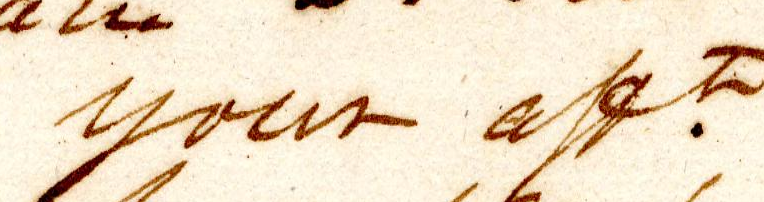your aff^t.
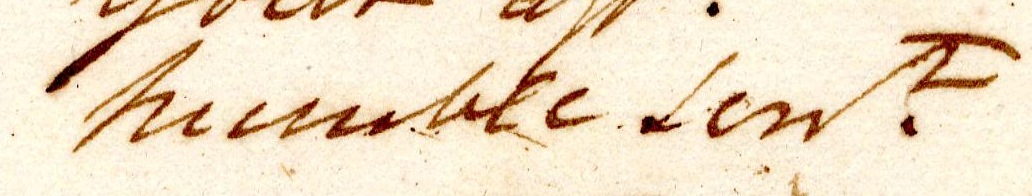humble Serv^t.
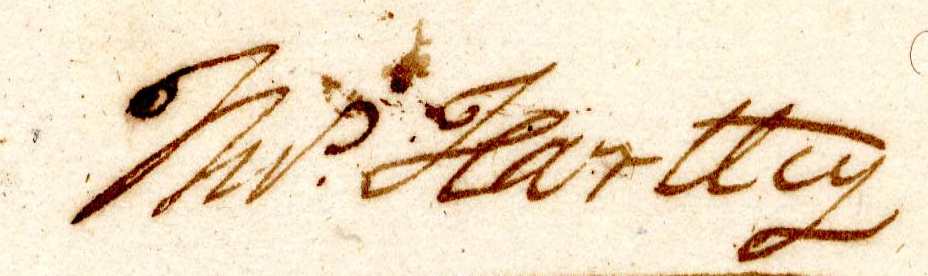Tho^s. Hartley
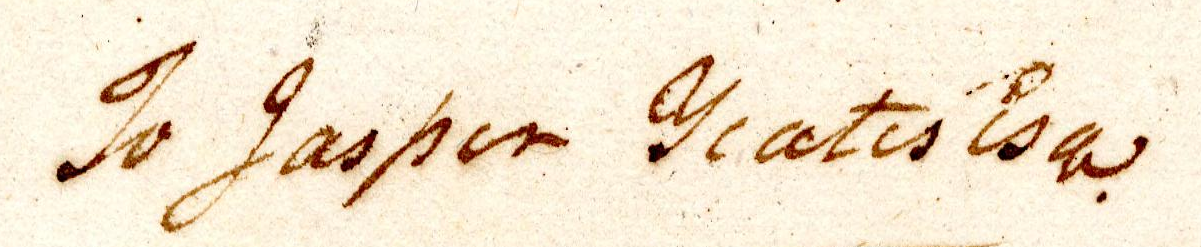To Jasper Yeates Esq^r.
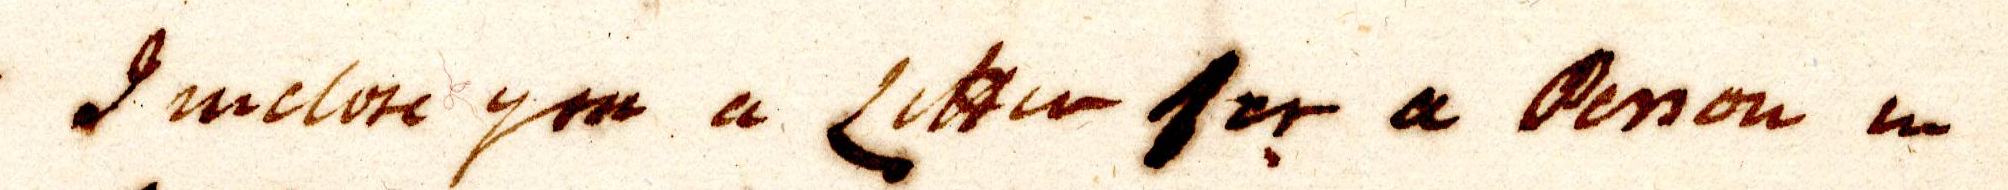I inclose you a Letter for a Person in
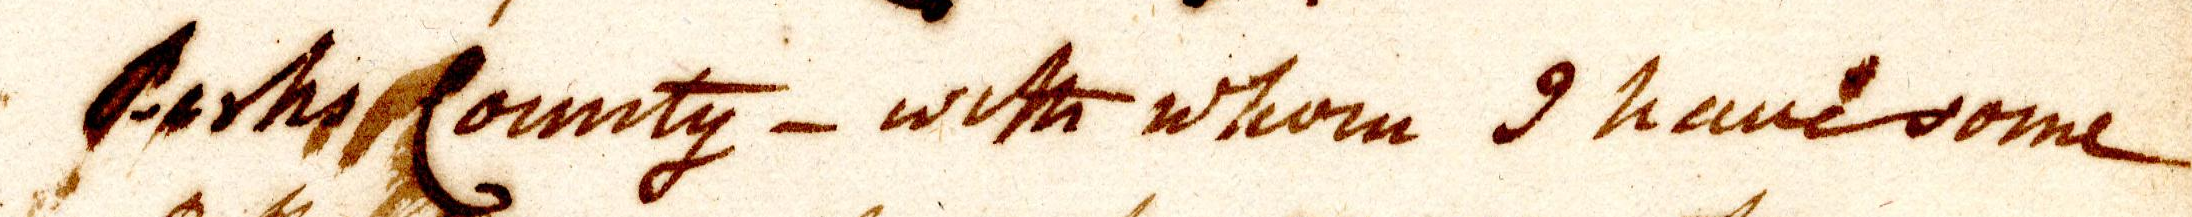Parks County- with whom I have some
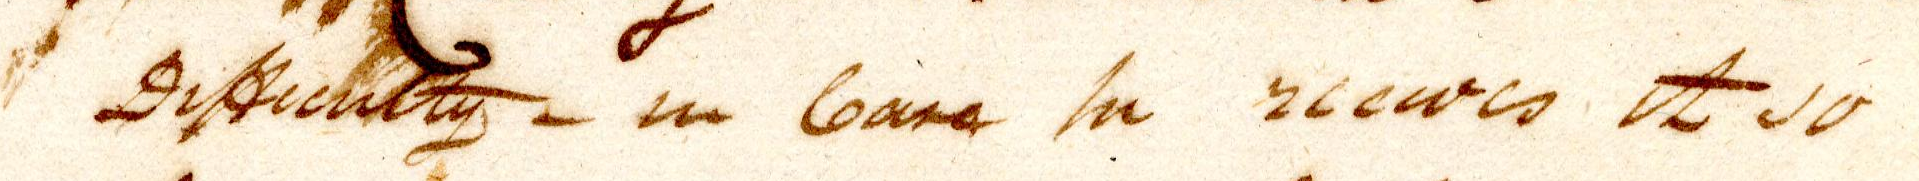Difficulty- in Care in recues it so
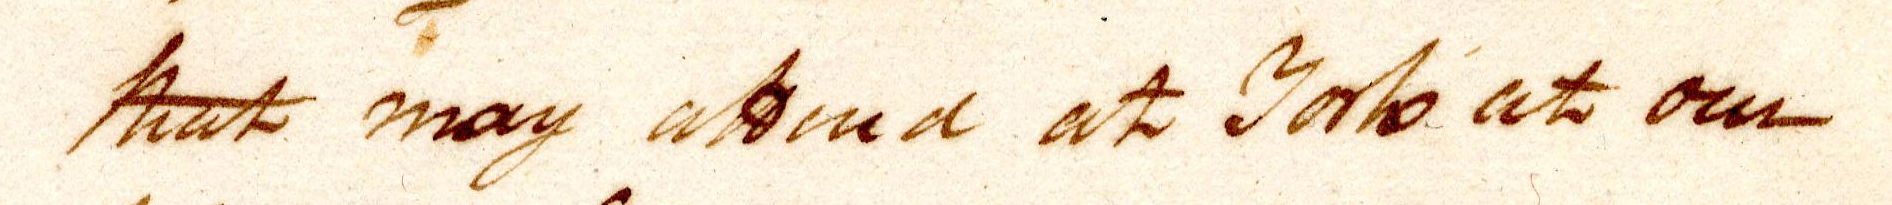that may attend at York at our
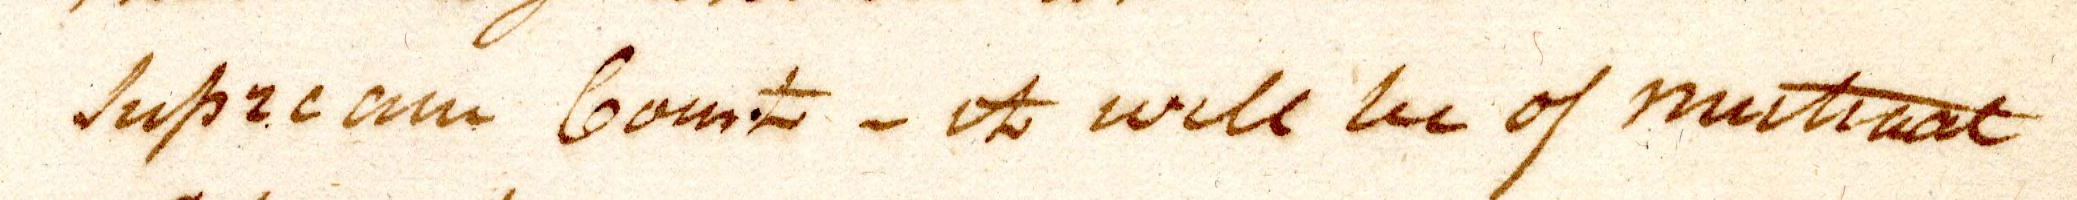supream Court. it will be of mutual
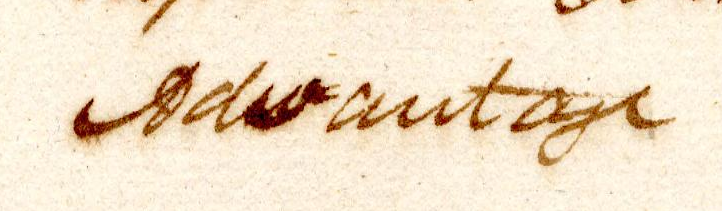Advantage
